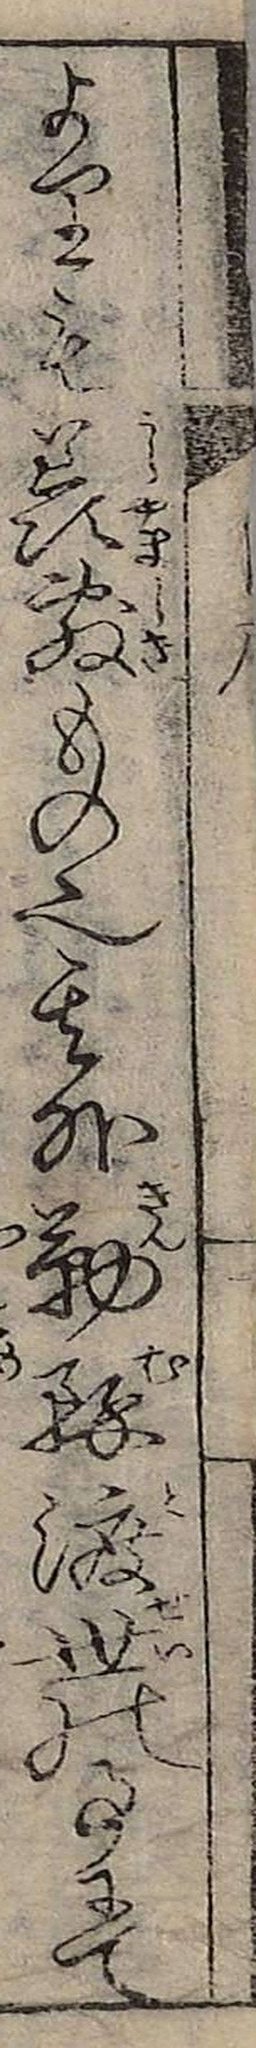よりも羨敷もの也其外勤務渡世の事にて
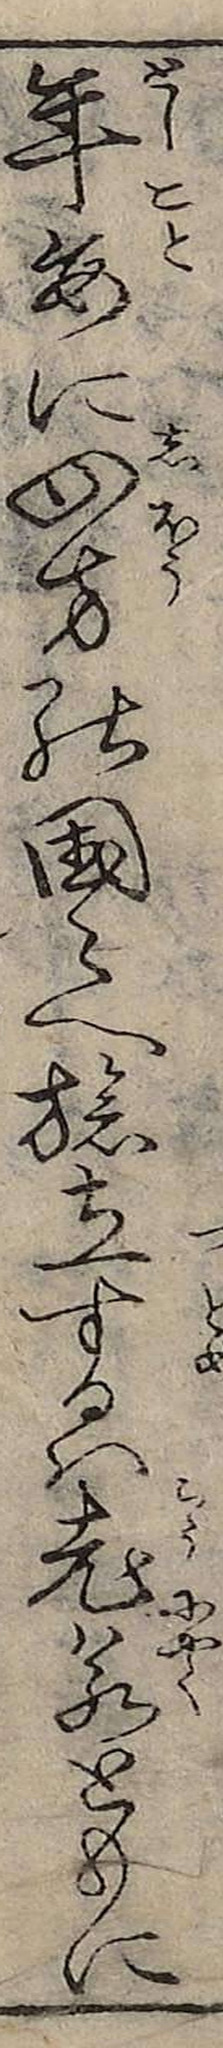年毎に四方の国々へ旅立するは老若ともに
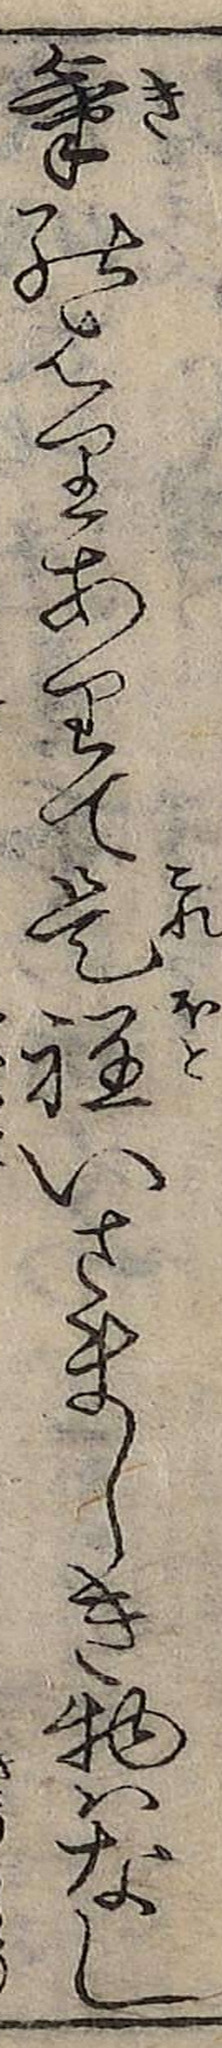気のはりありて是程いさましき物はなし
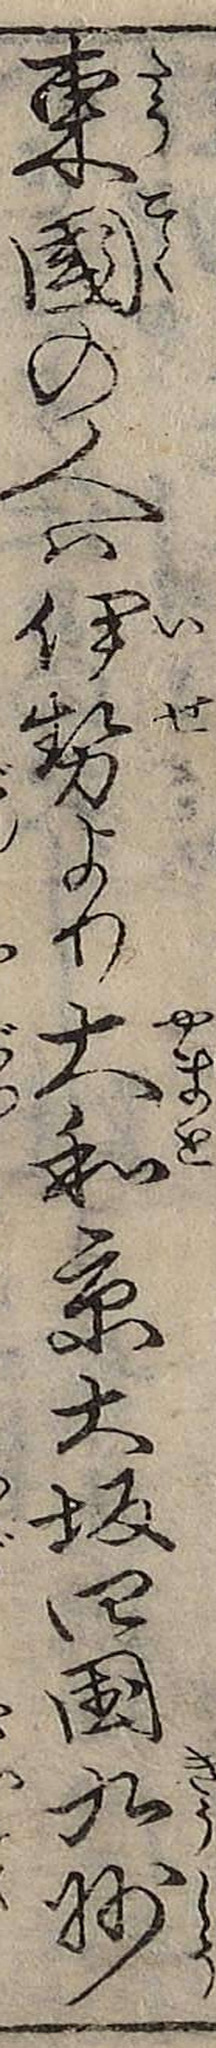東国の人は伊勢より大和京大坂四国九州
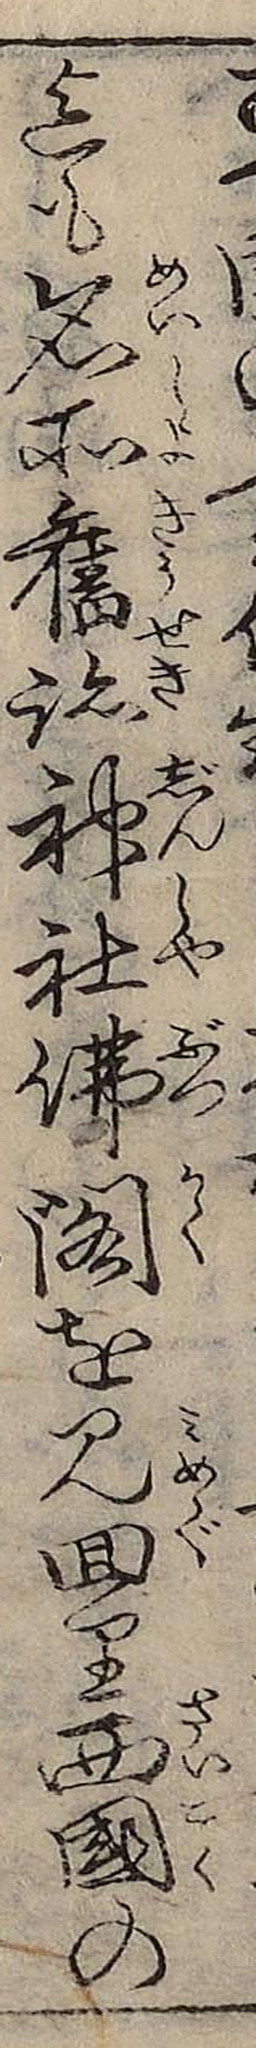迄も名所旧跡神社仏閣を見回り西国の
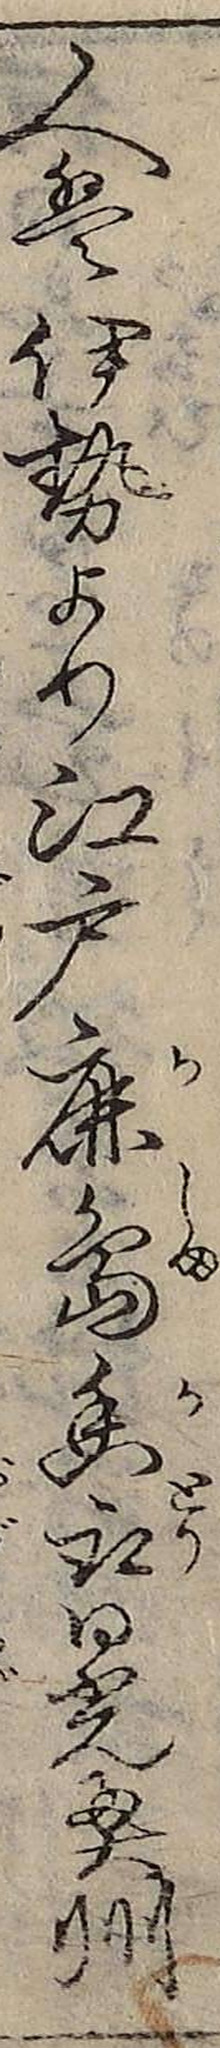人は伊勢より江戸鹿島香取日光奥州
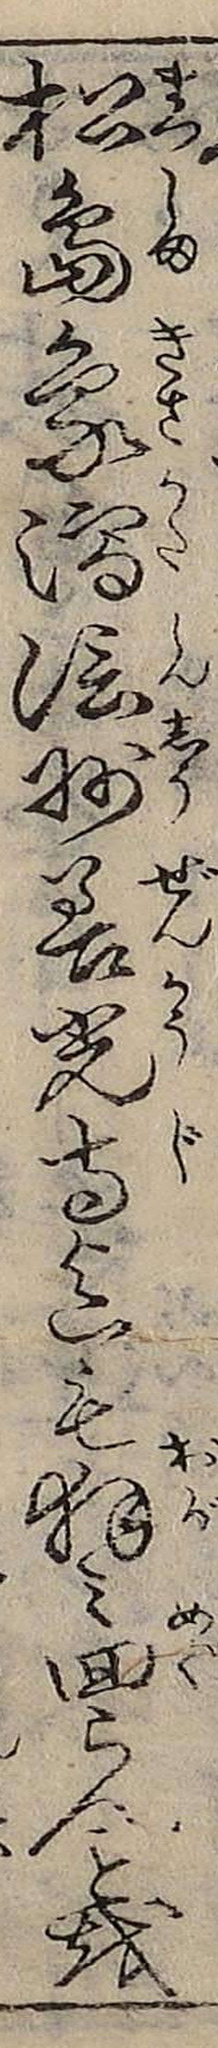松島象潟信州善光寺迄も拝み回らんことを
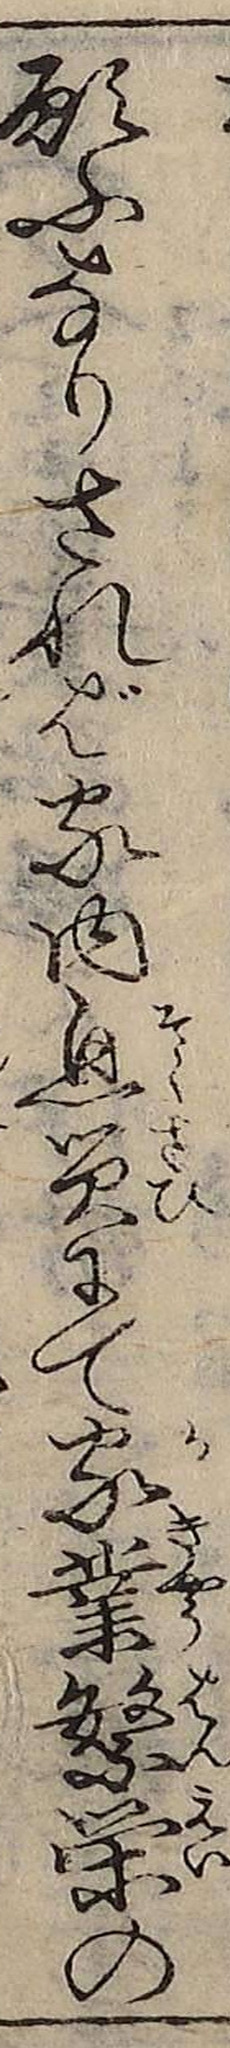願ふなりされば家内息災にて家業繁栄の
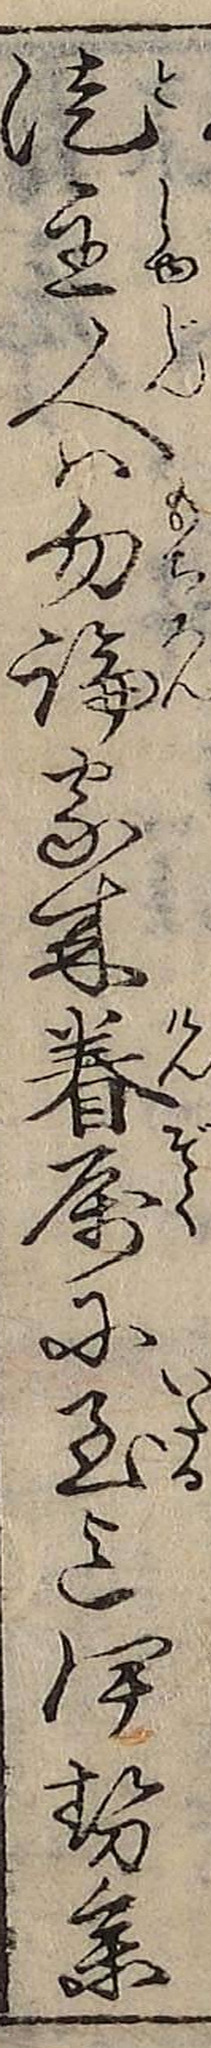徒主人は勿論家来眷属に至迄伊勢参
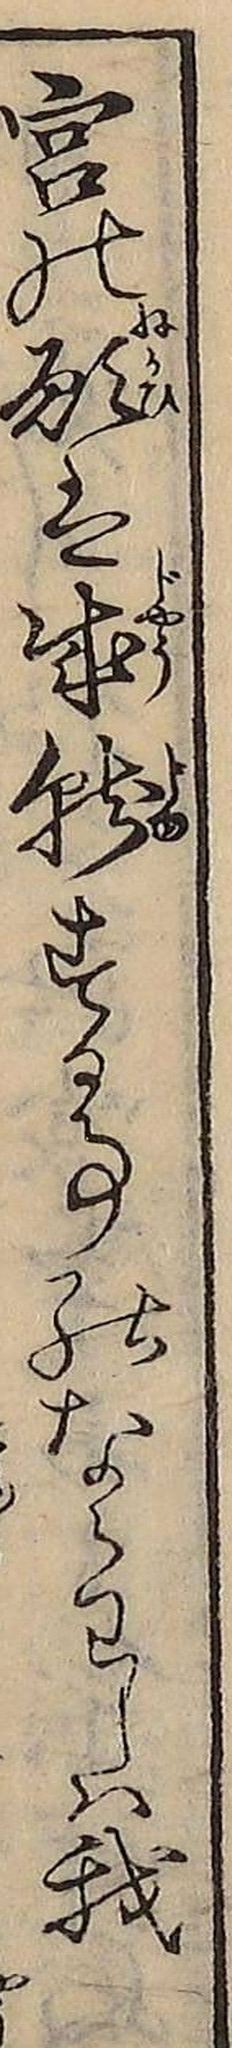宮の願は成就する事のならわしは我
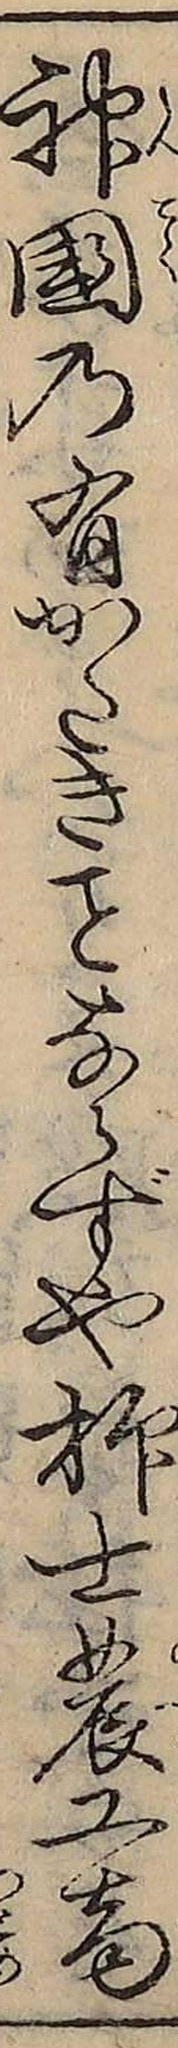神国の有かたきことならずや抑士農工商
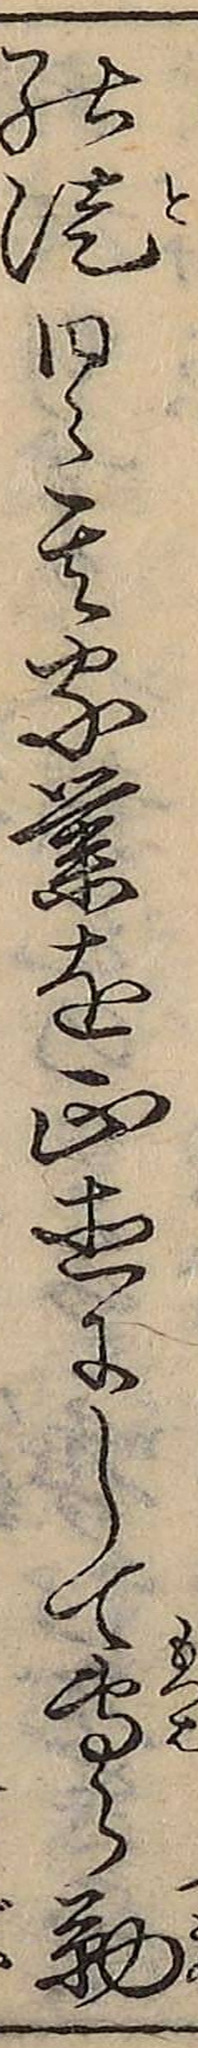の徒日々其家業を正直にして専ら勤
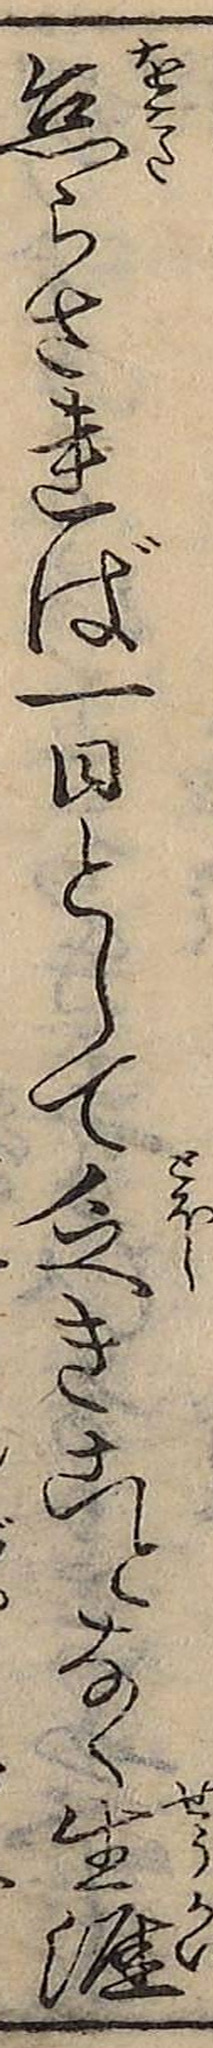怠らされば一日として乏きことなく生涯
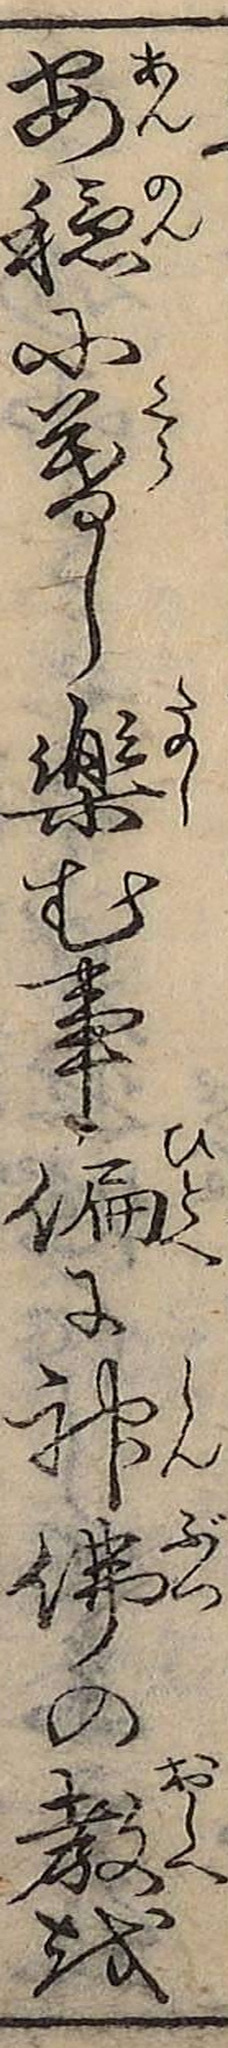安穏に暮し楽む事偏に神仏の教を
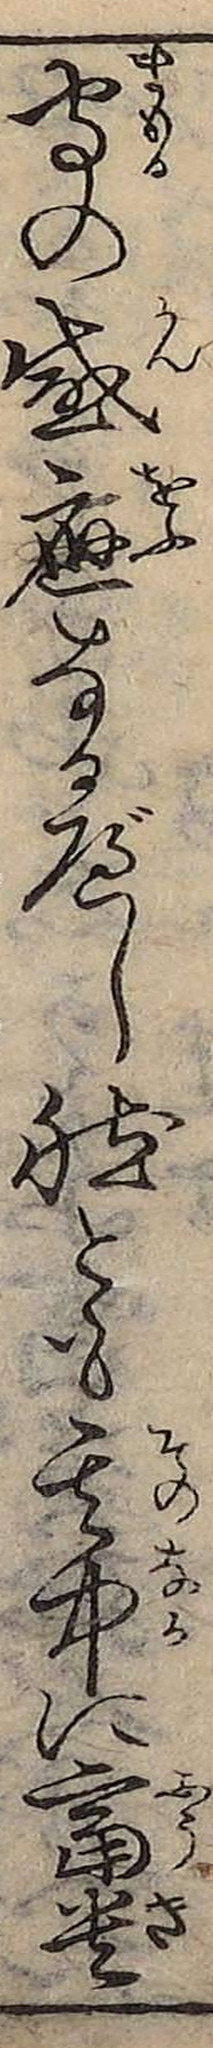守の感応なるべし然とも其中に富貴
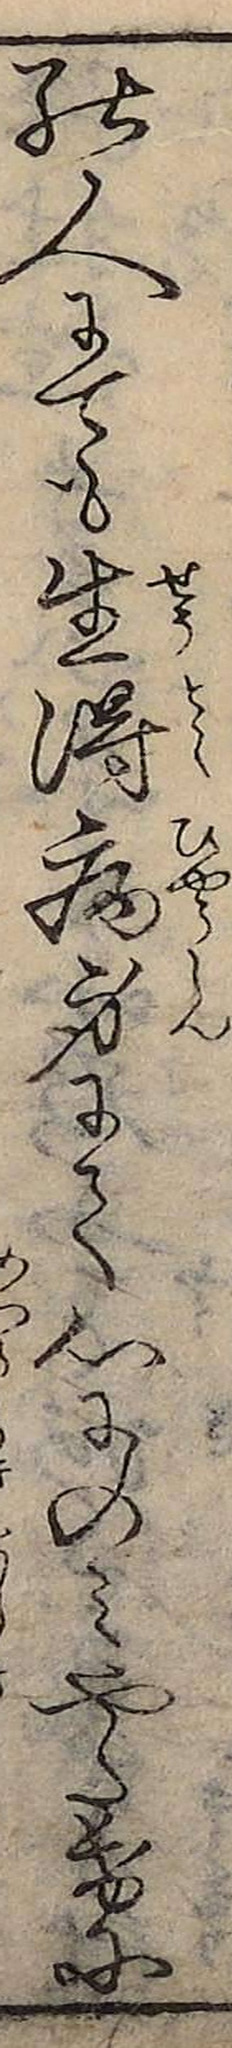の人にても生得病身にて心にのみやたけに
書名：旅行用心集
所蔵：神戸大学附属図書館 国文学研究資料館
